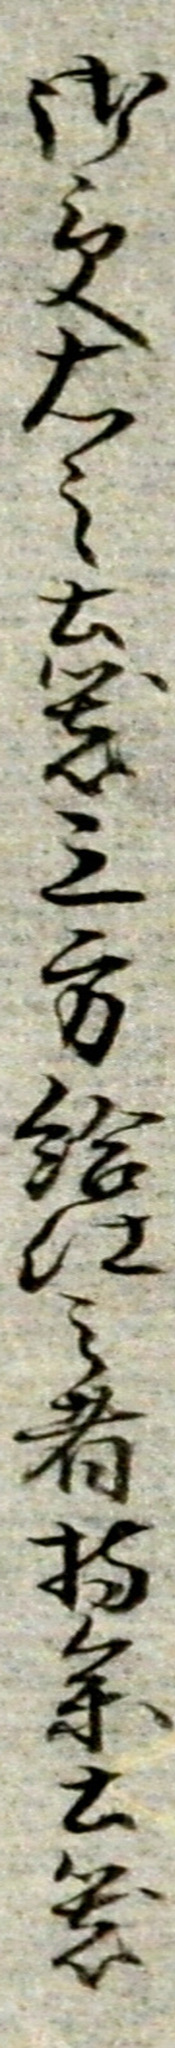御受右之土器三方給仕之者持参土器
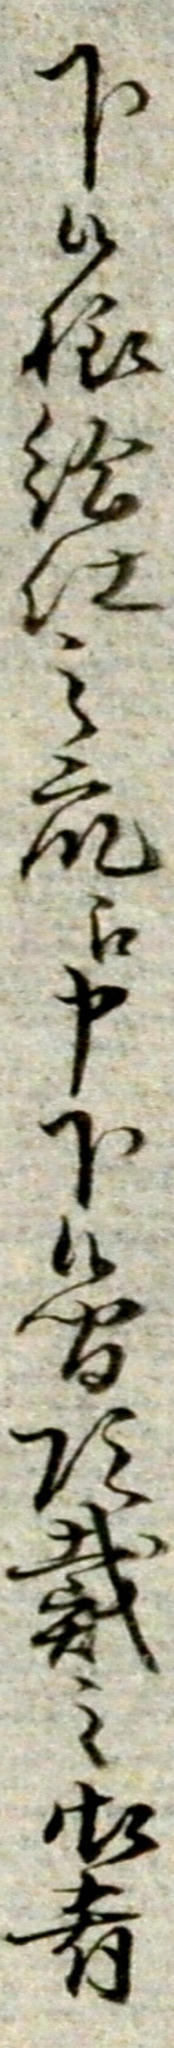下候様給仕之衆江申下候間頂戴之御肴
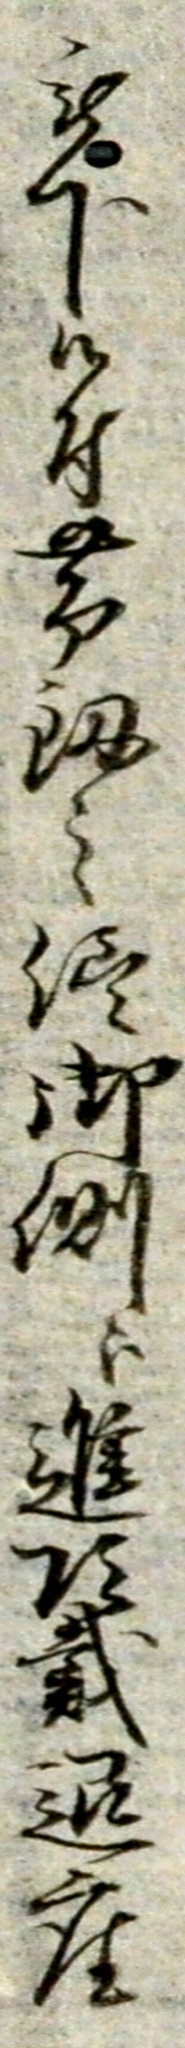被下候付帯剣之侭御側江進頂戴退座
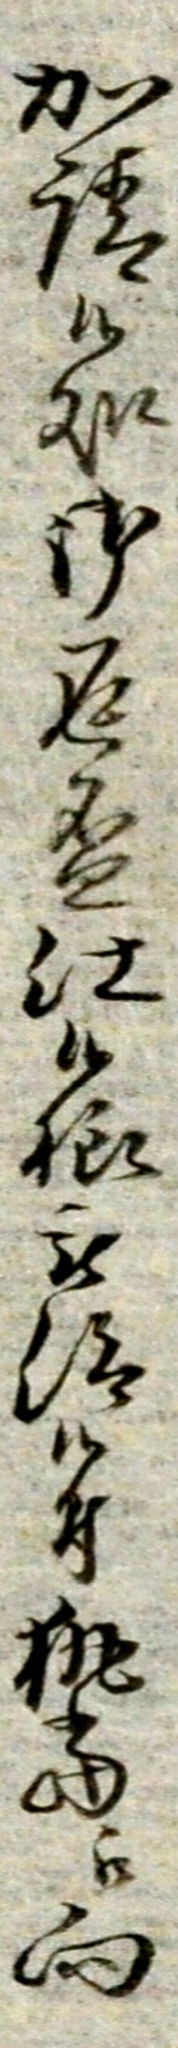加請候処御返盃仕候様被仰候付執當江向
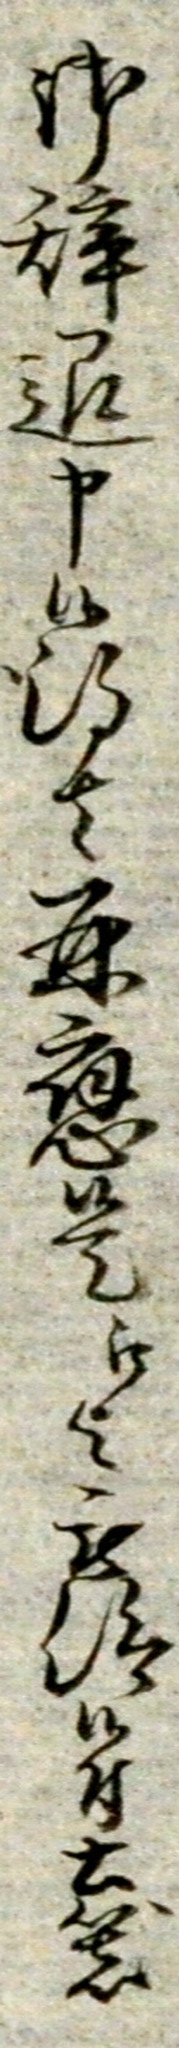御辞退申候得者再応是江与被仰候付土器
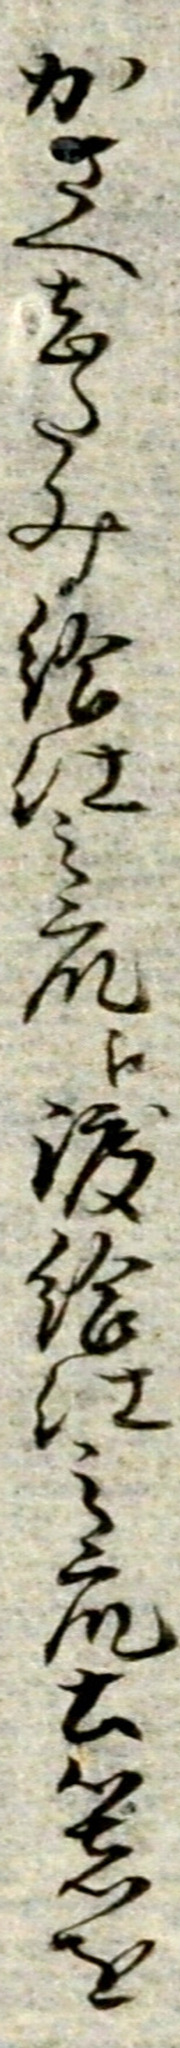かさへしたみ給仕之衆江渡給仕之衆土器を
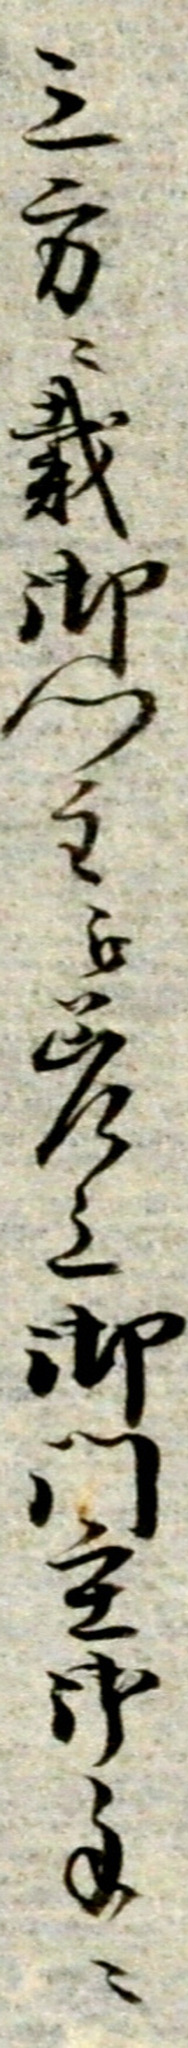三方に載御門主江差上御門主御手に
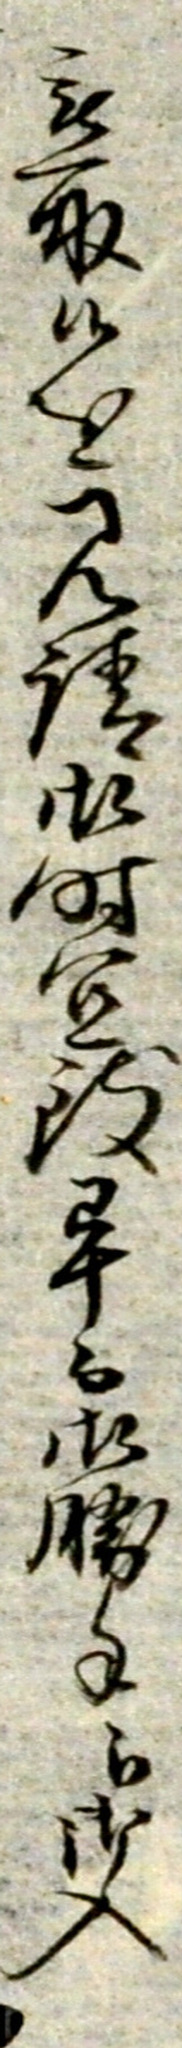被取候を見請御時宜致畢而御勝手江御入
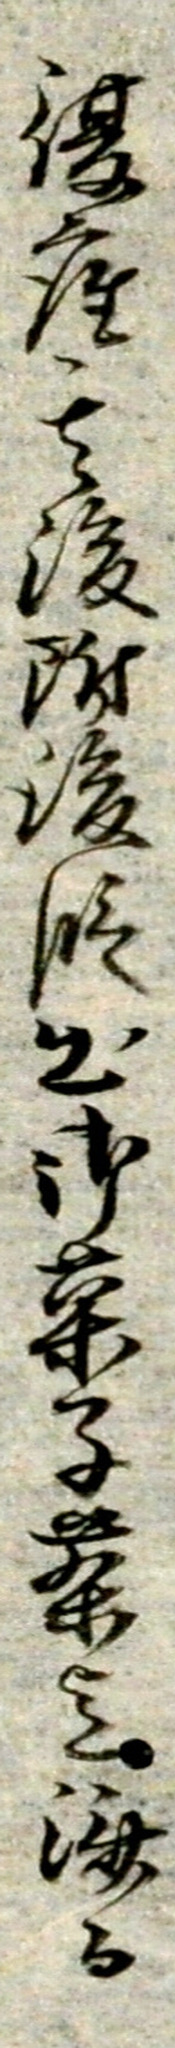復座其後附後段出御菓子茶迄済
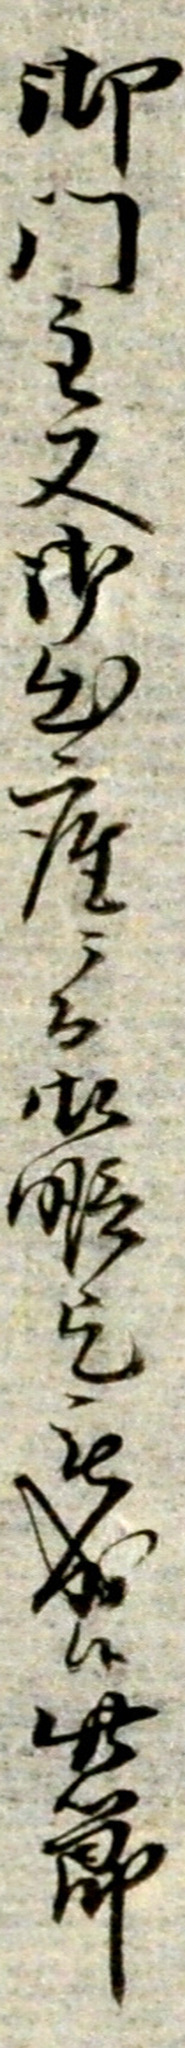御門主又御出座ニ而御暇乞被成候此節
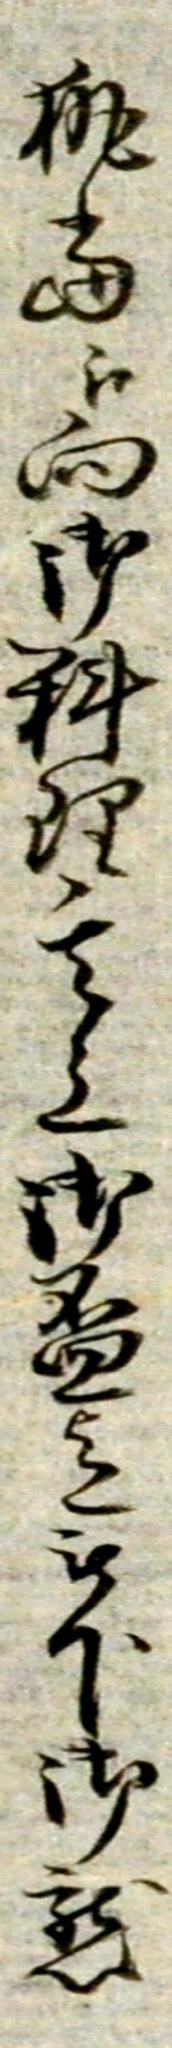執当江向御料理其上御盃迄被下御懇
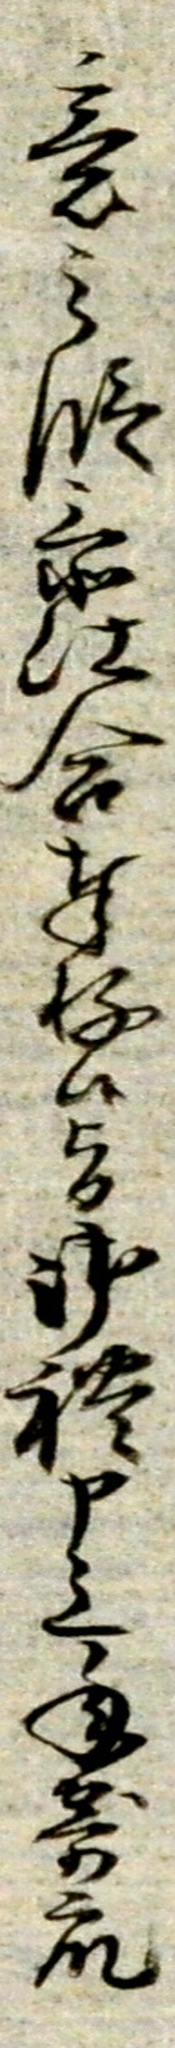意之段忝仕合奉存候旨御礼申上年寄衆
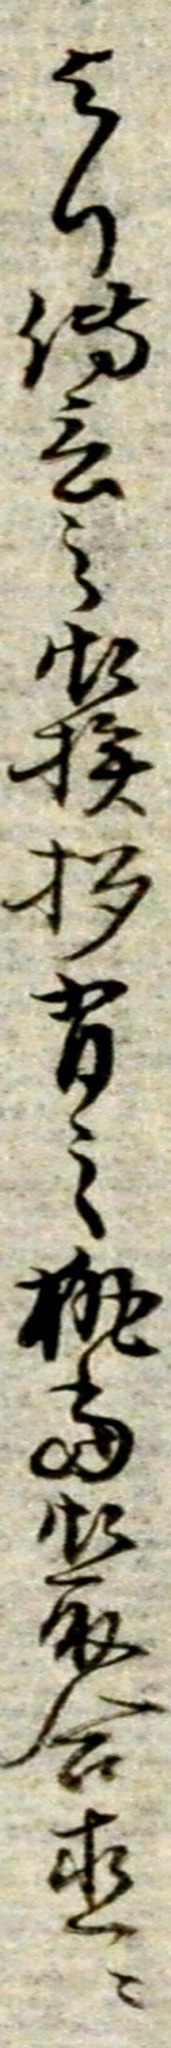より伝言之御挨拶有之執当御取合直ニ
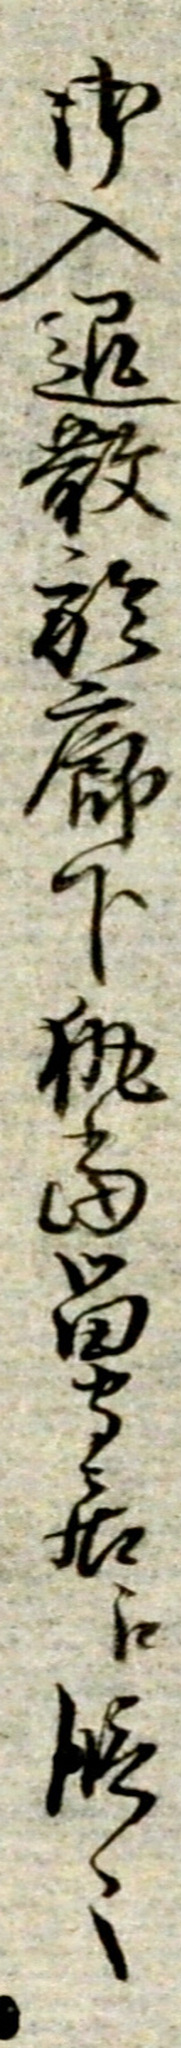御入退散於廊下執当留守居江段々
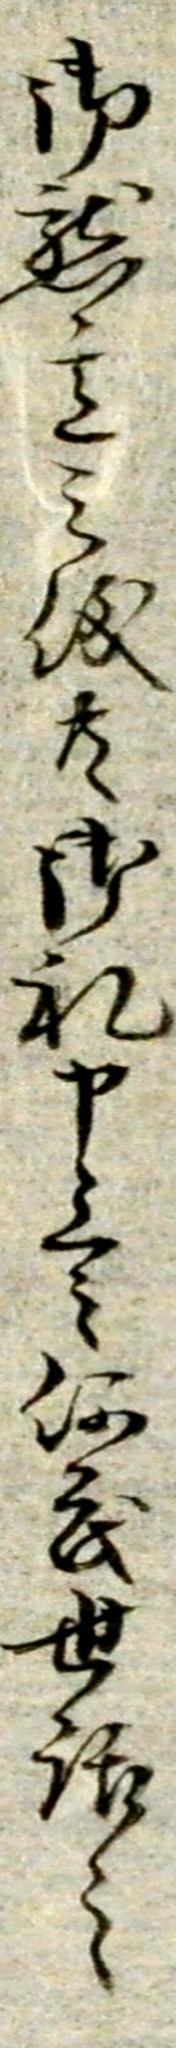御懇意之儀共御礼申上之何も世話之
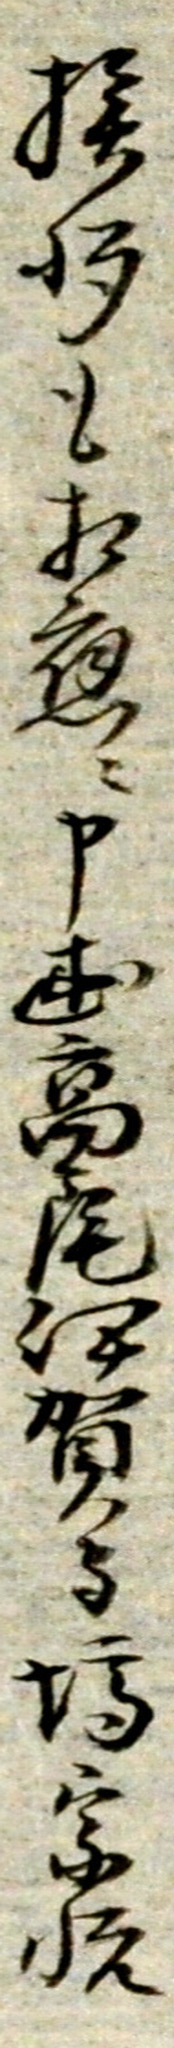挨拶も相応ニ申述高尾伊賀守塙宗悦
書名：日光御名代相勤候節ノ留
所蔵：伊那市立高遠町図書館・合同会社AMANE
